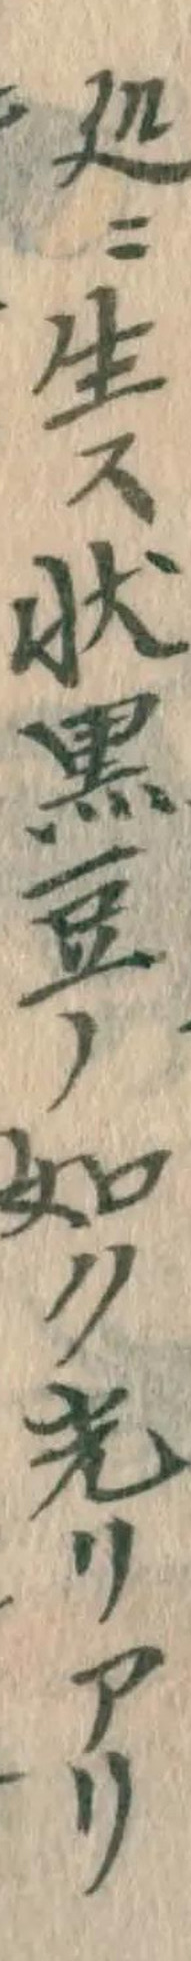処ニ生ス状黒豆ノ如ク光リアリ
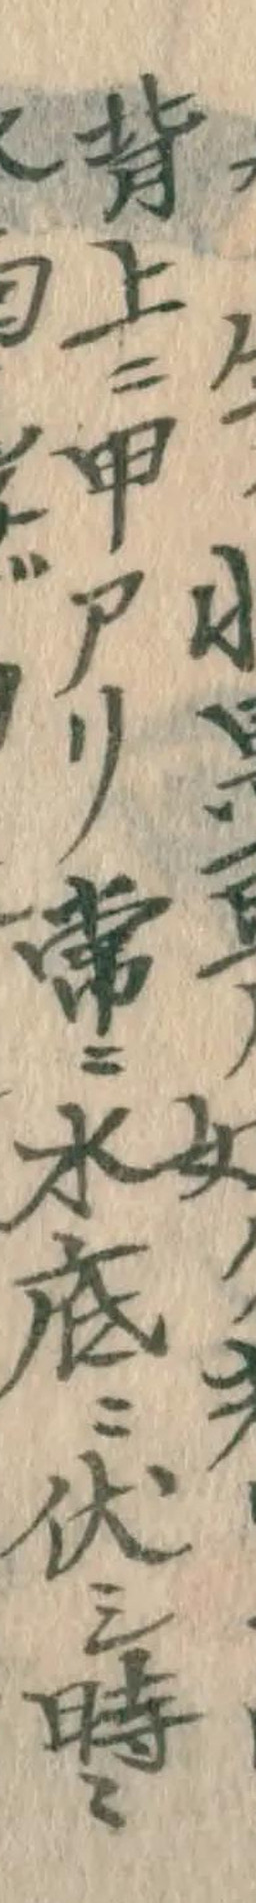背上ニ甲アリ常ニ水底ニ伏シ時々
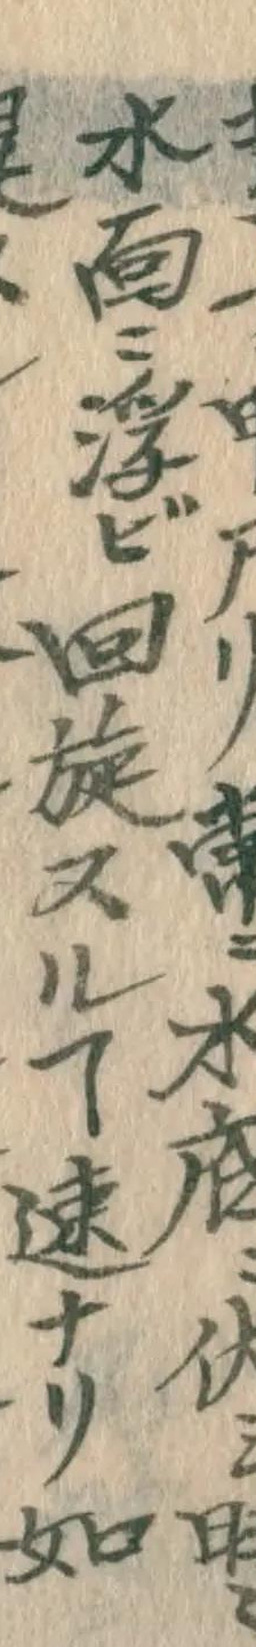水靣ニ浮ビ回旋スルコト速ナリ如
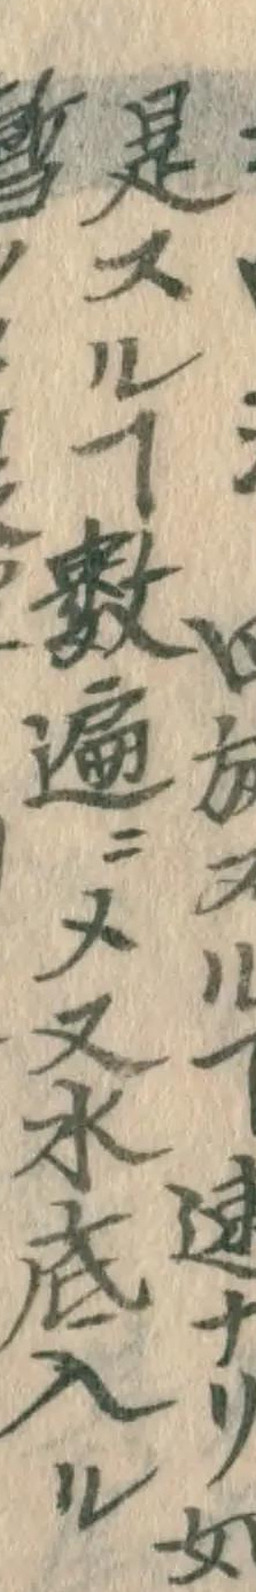是スルコト数遍ニシテ又水底入ル
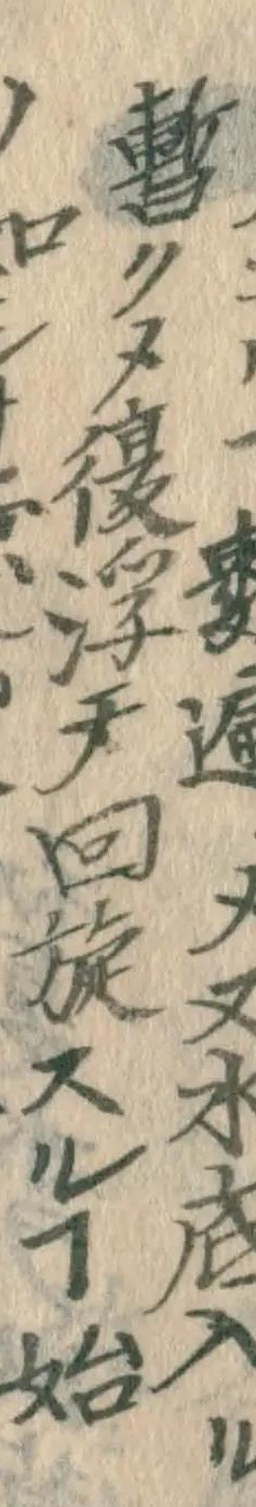暫クシテ復浮テ回旋スルコト始
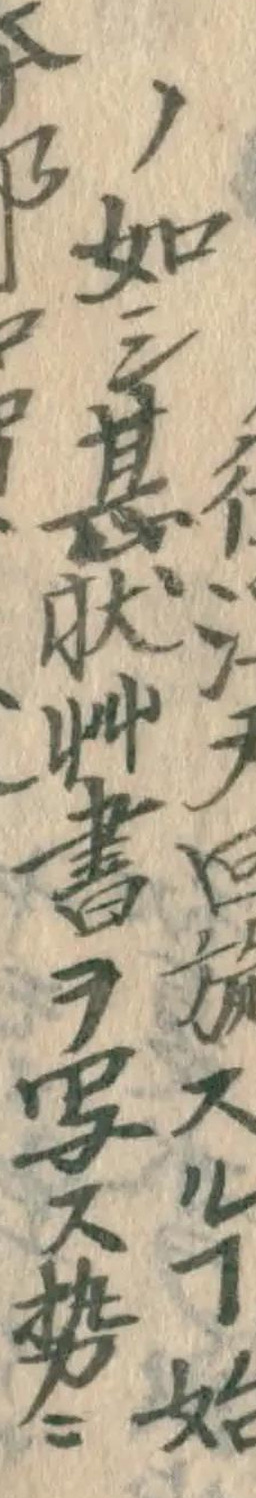ノ如シ其状艸書ヲ写ス势ニ
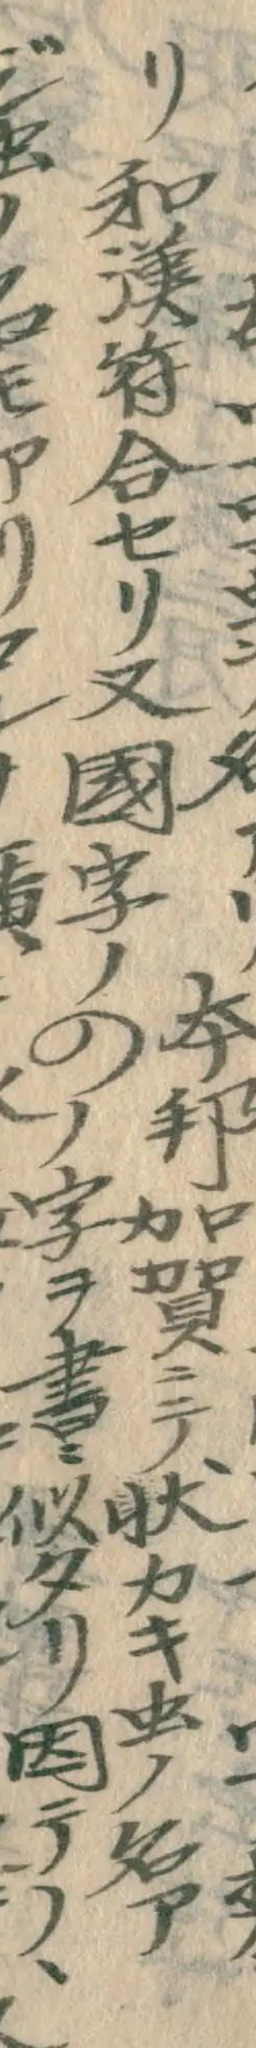リ和漢符合セリ又國字ノのノ字ヲ書ニ似タリ因テノヽ
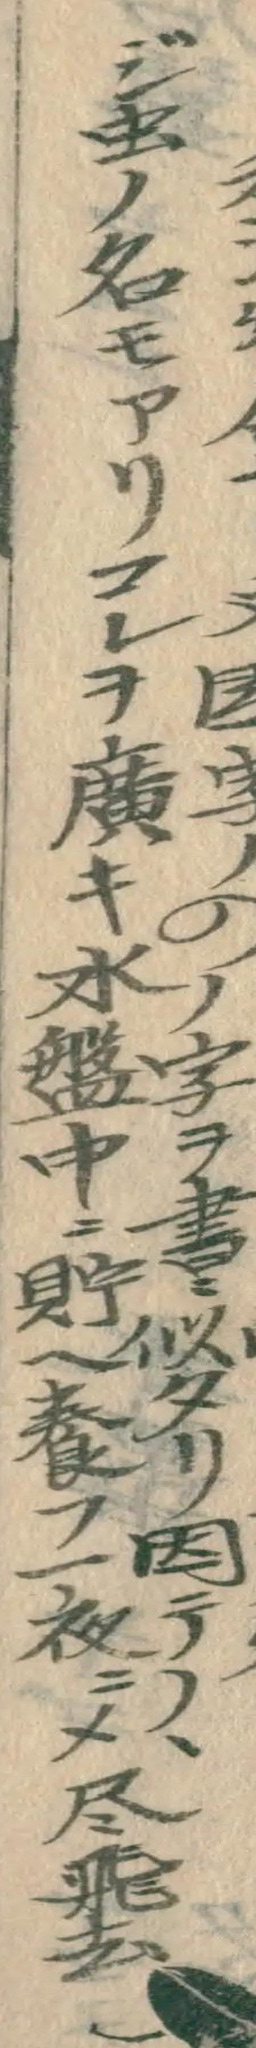ジ虫ノ名モアリコレヲ廣キ水盤中ニ貯ヘ養フ一夜ニシテ尽飛去

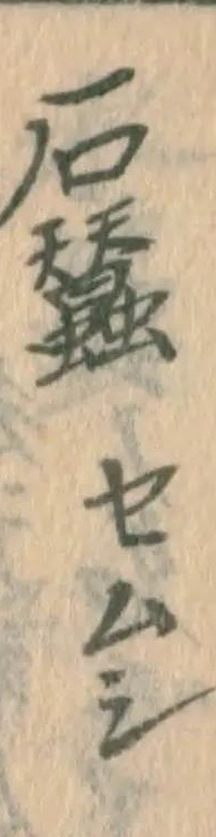石蠺セムシ
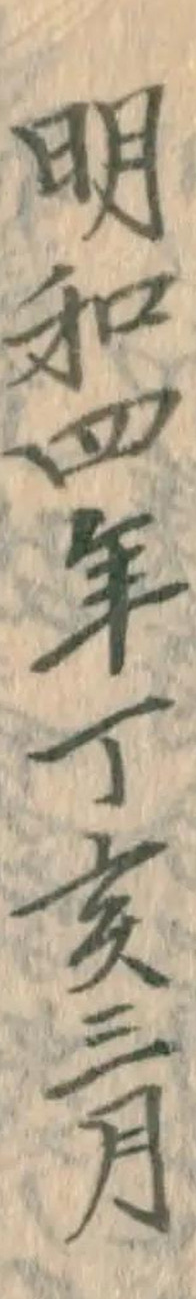明和四年丁亥三月
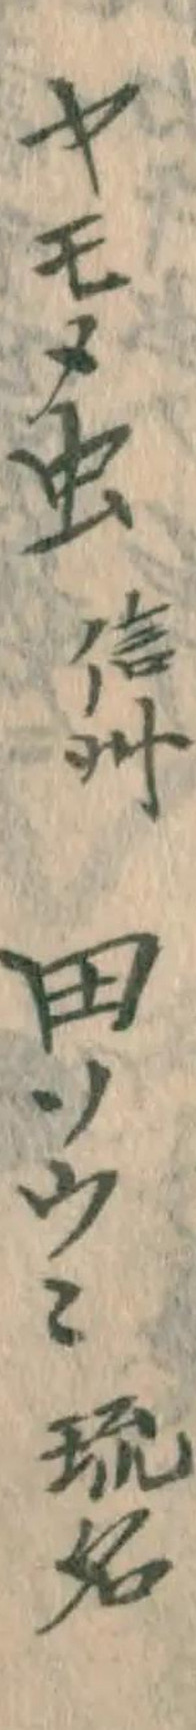ヤモメ虫信州田ソウ々琉名
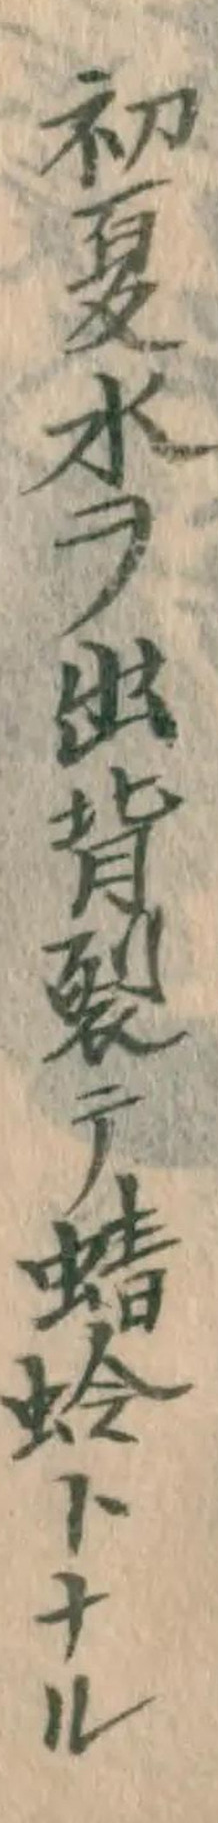初夏水ヲ出背裂テ蜻蛉トナル
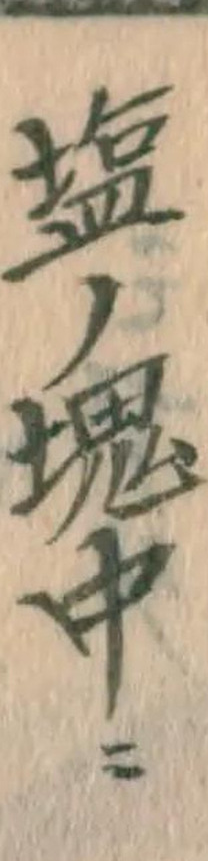塩ノ塊中ニ
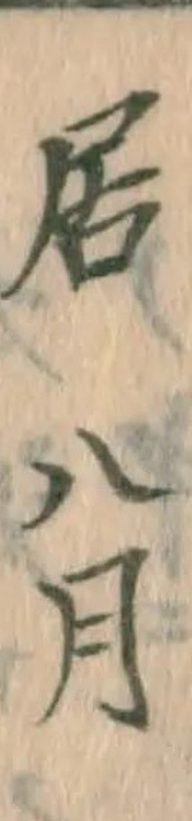居八月
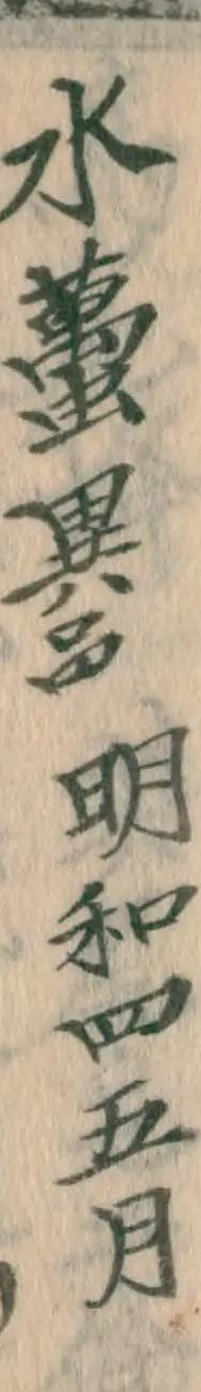水蠆異品明和四五月
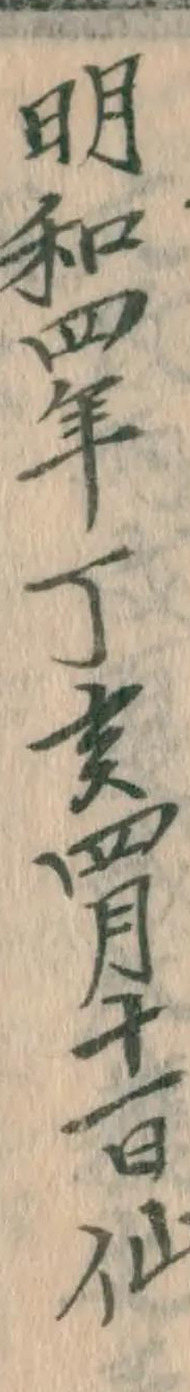明和四年丁亥四月十一日仙
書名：千蟲譜 3巻. [2]
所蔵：国立国会図書館 National Diet Library, JAPAN
